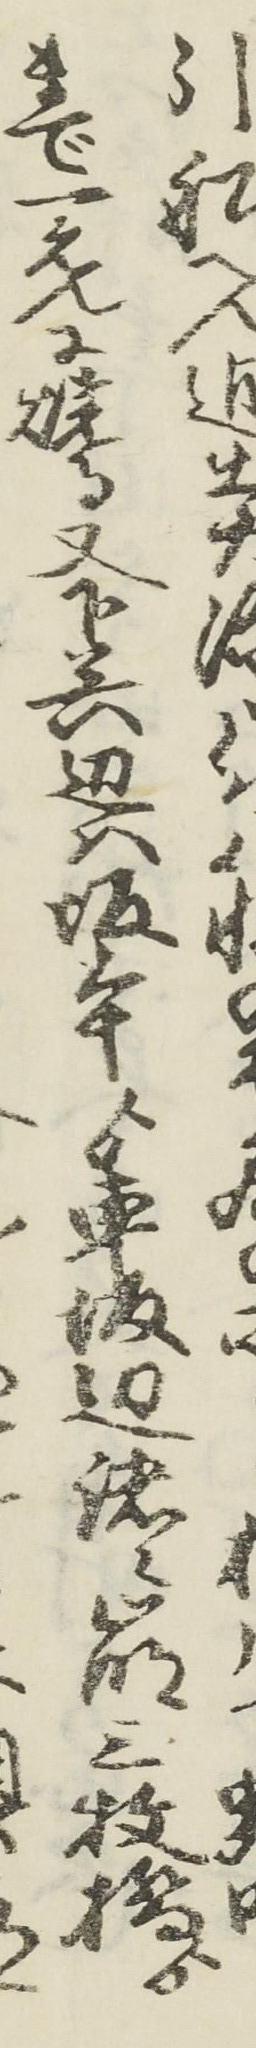まで一えんに焼る又下谷辺は坂本ゟ車坂辺諸〻崩三牧橋ゟ
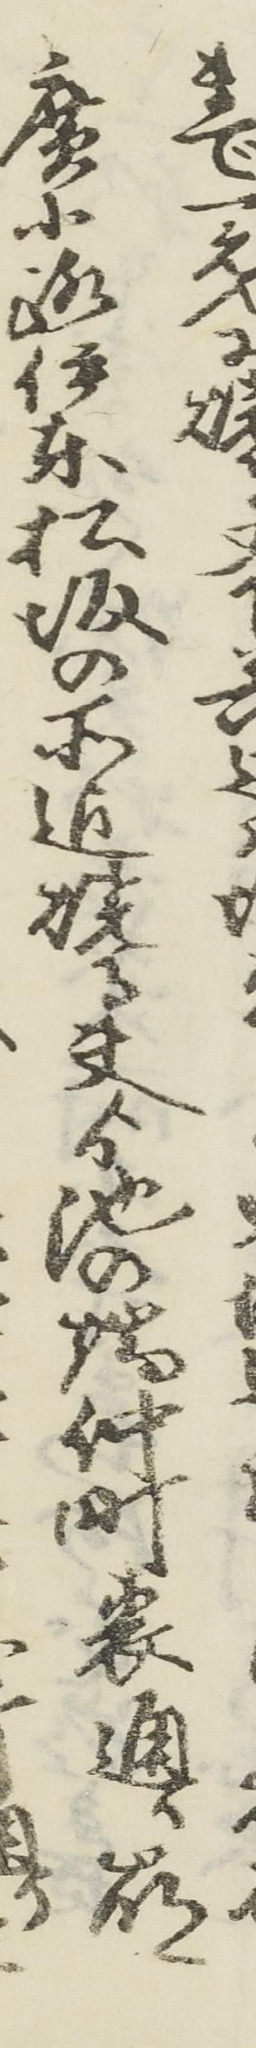広小路伊東松坂の所迄焼る夫ゟ池の端仲町表通り崩
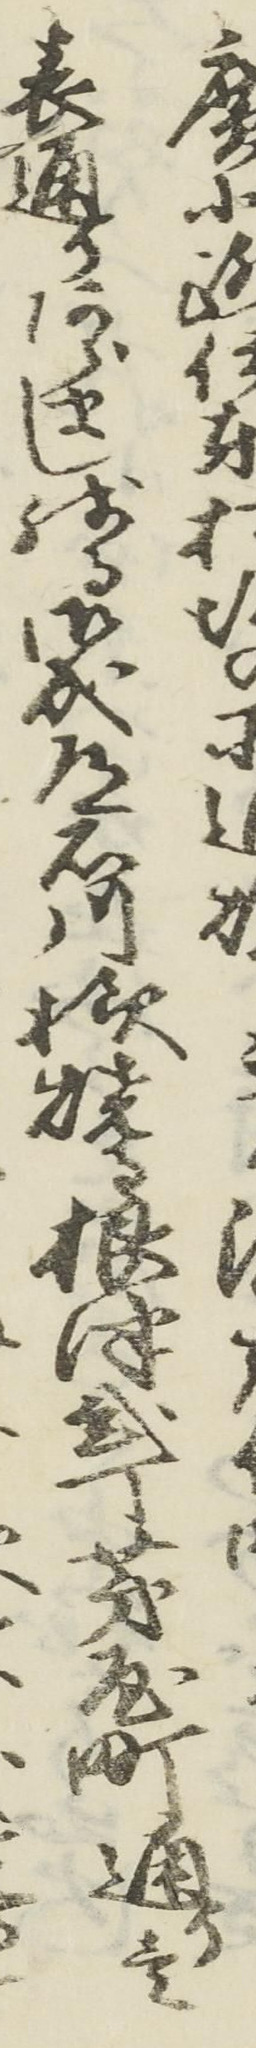表通りあらまし残る御成道石川様焼る根津弐丁茅屋町通り壱
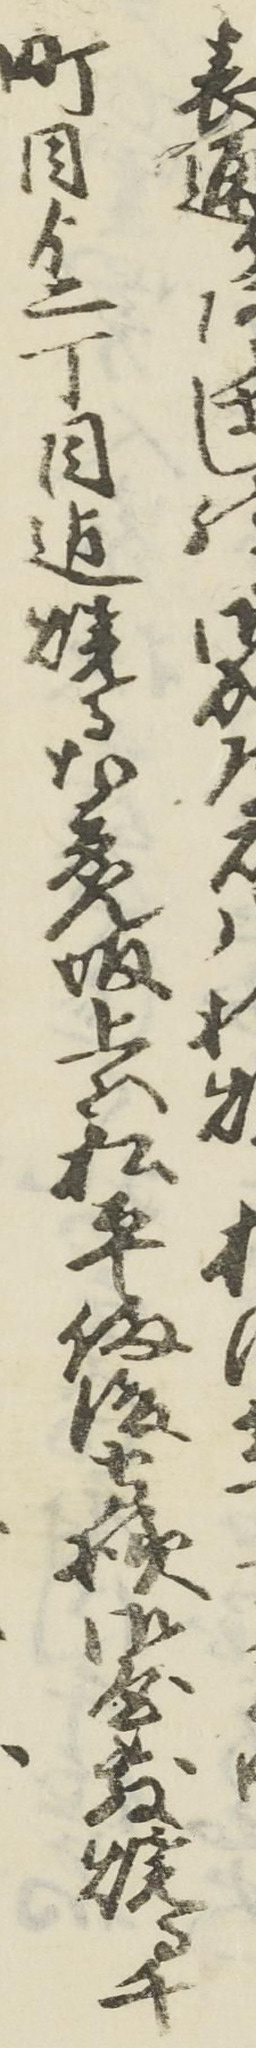町目ゟ二丁目迄焼るむえん坂上は松平備後守様御屋敷焼る千
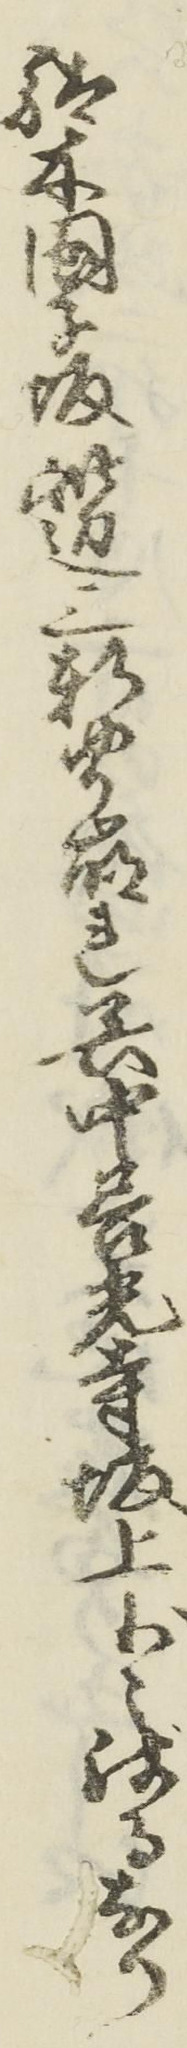駄木団子坂此辺三軒ゆり崩れ谷中善光寺坂上少〻残るなり
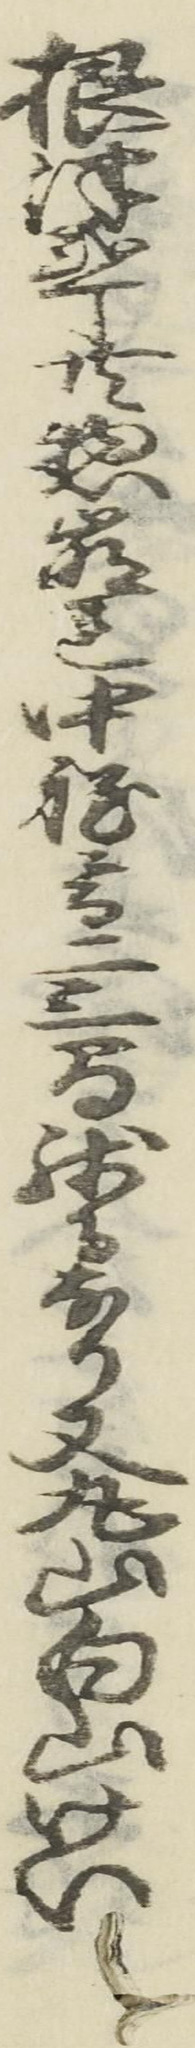根津弐丁共惣崩れ中程ニ而二三間残るなり又丸山白山けい
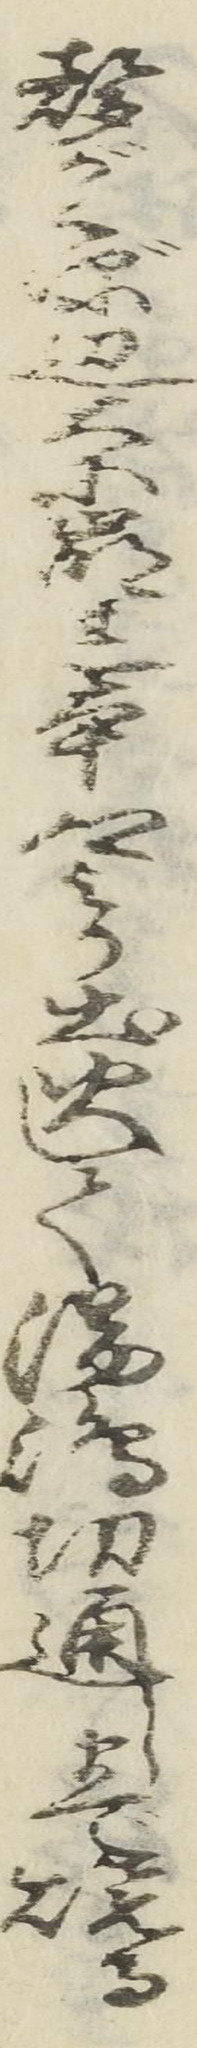聲がくぼ辺大に崩れ本郷より出火して湯島切通しまで焼る
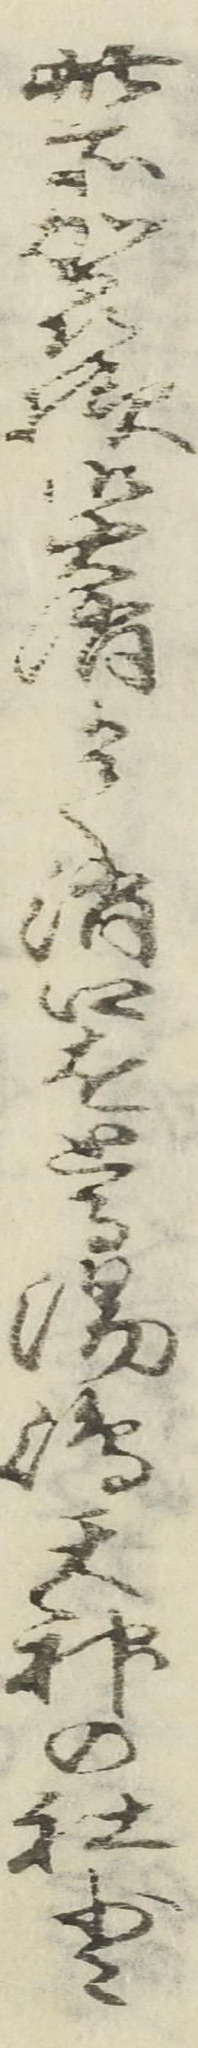此所加州様御火消にて消口をとる湯島天神の社少〻
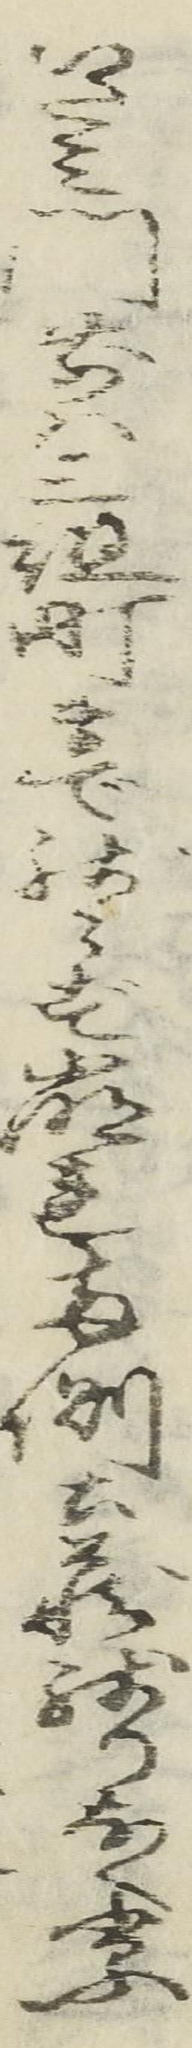いたみ門前は三組町まで残らず崩れ両側土蔵残りなくふるふ
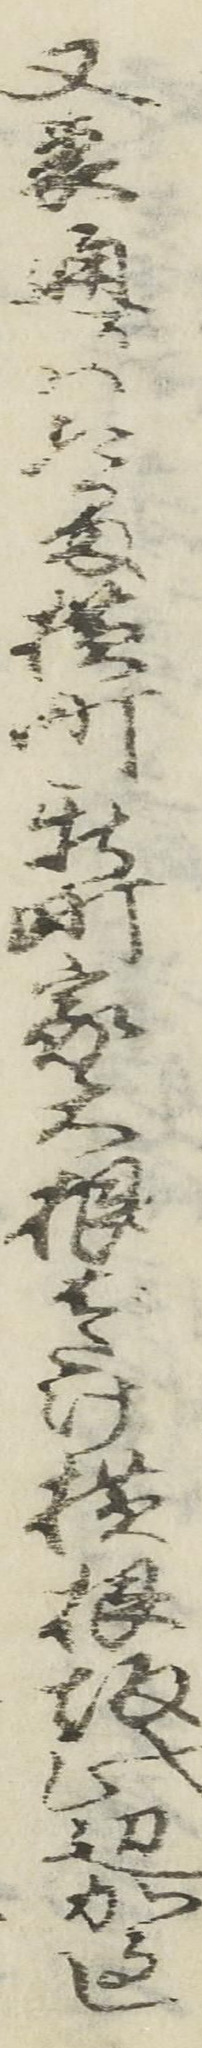又裏通りは横町新町家大根ばたけ横根坂此辺かるし
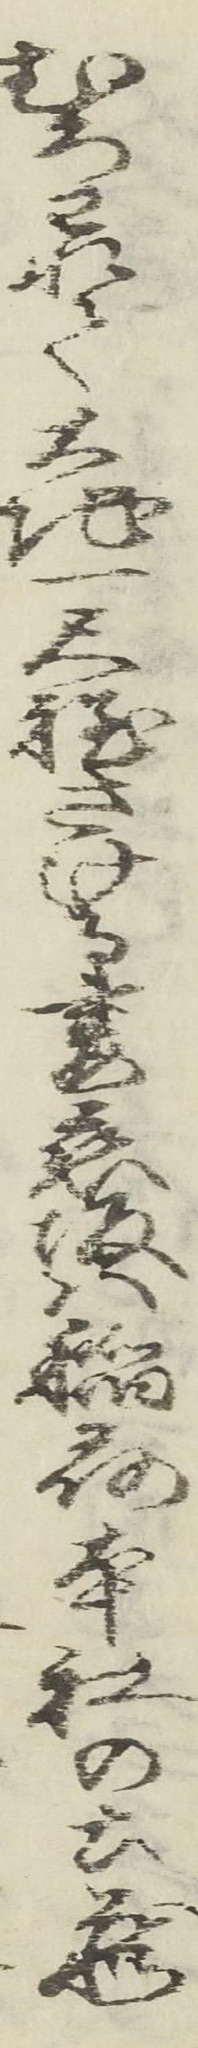むろわれて大地一尺程さける妻恋坂は稲荷本社の土蔵
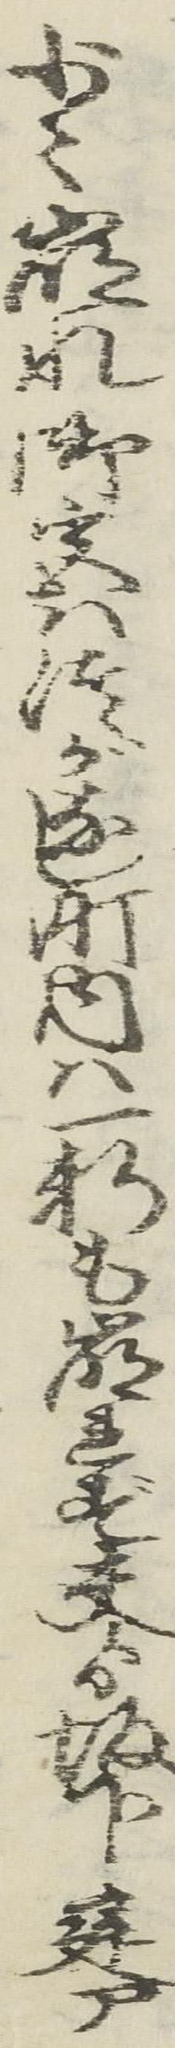少〻崩れ御宮はつゝがなし町内は一軒も崩れず夫ゟ坂下建部
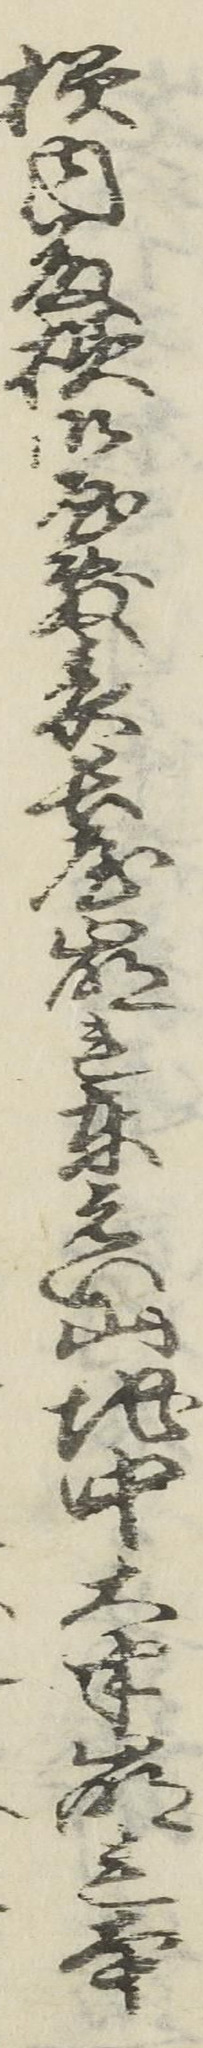様内藤様御屋敷表長屋崩れ東えい山地中大半崩れ本
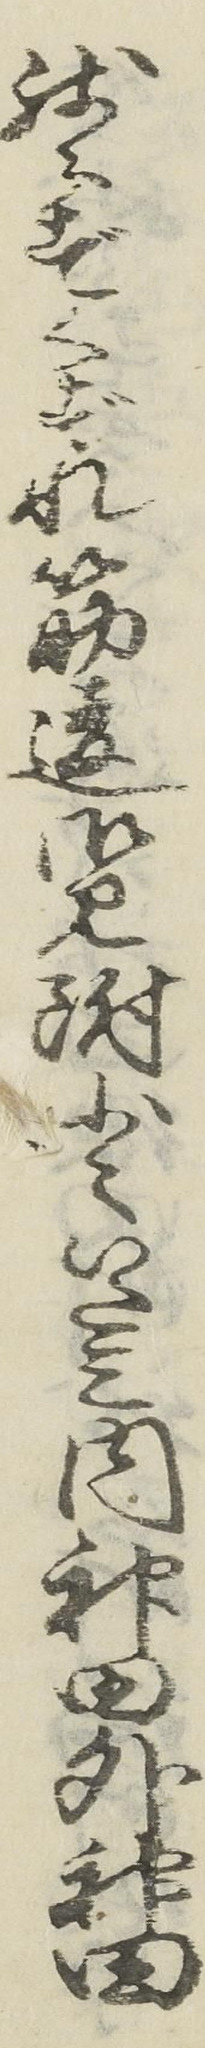残らずくずれ筋違御見附少〻いたみ内神田外神田

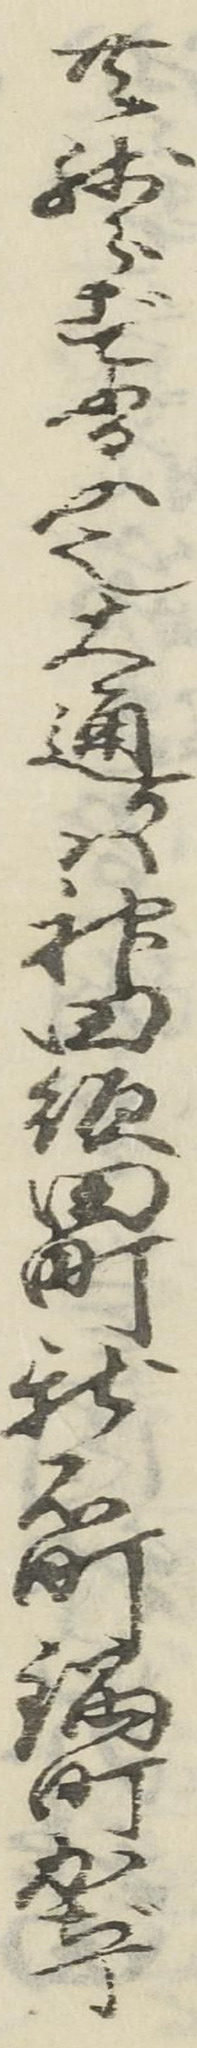共残らずふるふ也大通りは神田須田町新石町鍋町かぢ丁
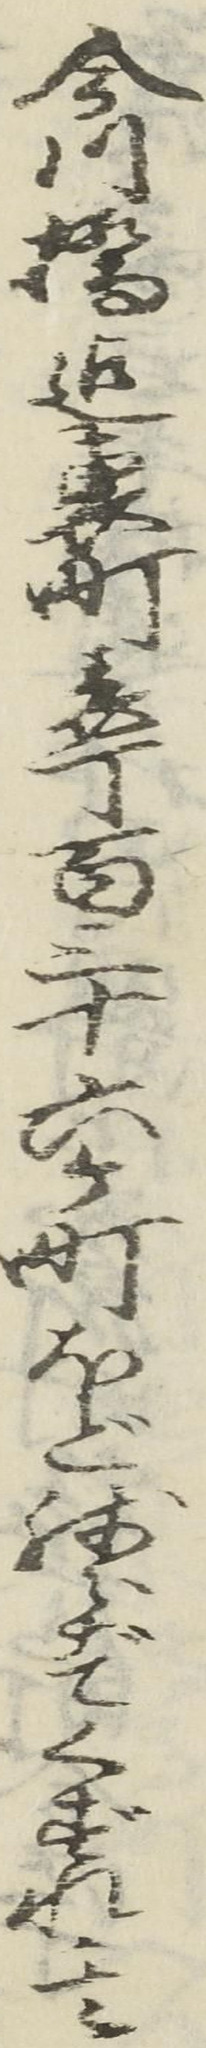今川橋迄裏町表丁百三十六ケ町ほど残らずくずれ其
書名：安政乙卯江戸大地震筆記　安政丙辰八月大阪大雷雨之記追加　安政三辰年七月松前辺大地震并八月大風雨記録
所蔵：東京大学地震研究所図書室 Earthquake Research Institute Library, The University of Tokyo, JAPAN
